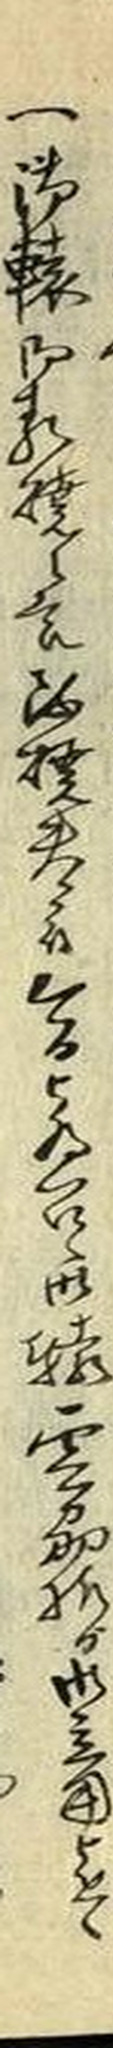一御轅御類焼之節致焼失候ニ付今日被為召候御轅雲州様ゟ御立用被進候
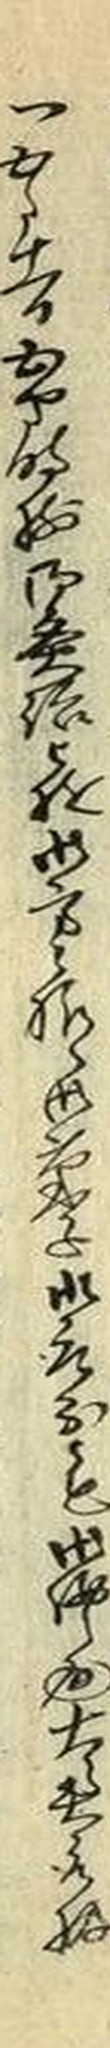一五月十一日五半時揃御灸治被遊御方々様へ御菓子御取分被進御例之通大奥取扱
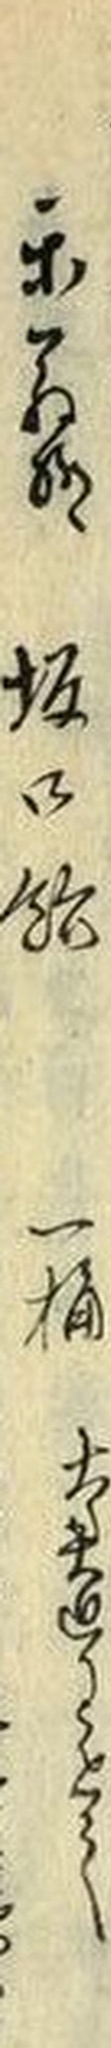楽翁様へ坂口飴一桶大奥廻り被進之
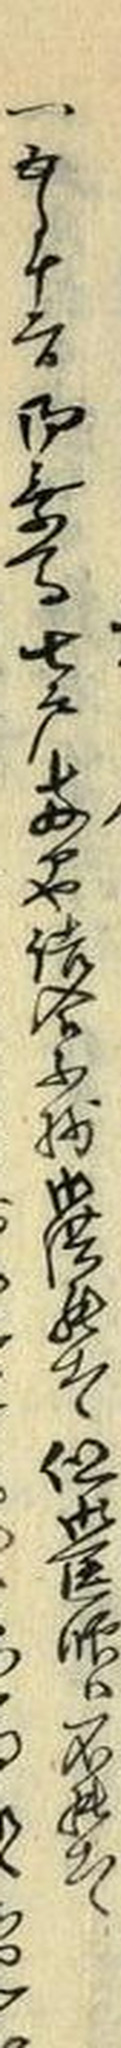一五月十二日御乗馬七戸両部や詰合不残御供罷出候但御医師ハ不罷出候
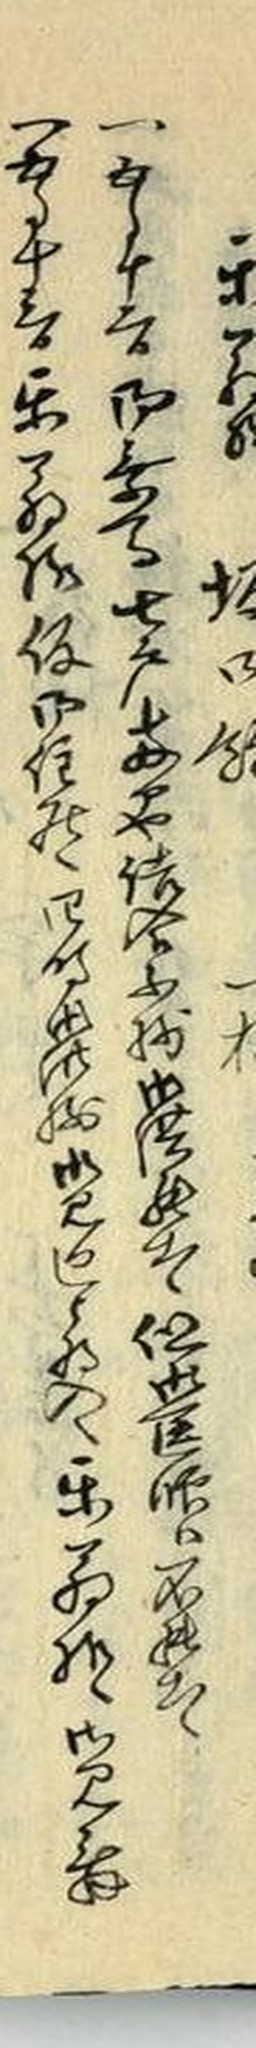一五月十三日楽翁様仮御住居へ四時御供揃御見廻被為入候楽翁様へ御見舞
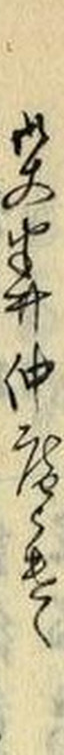御使半井仲庵被遣候
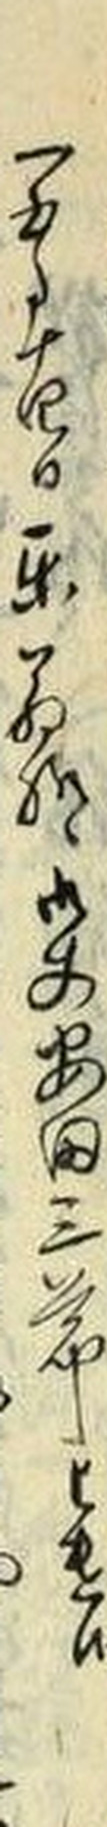一五月十四日楽翁様へ御使安田三節被遣候
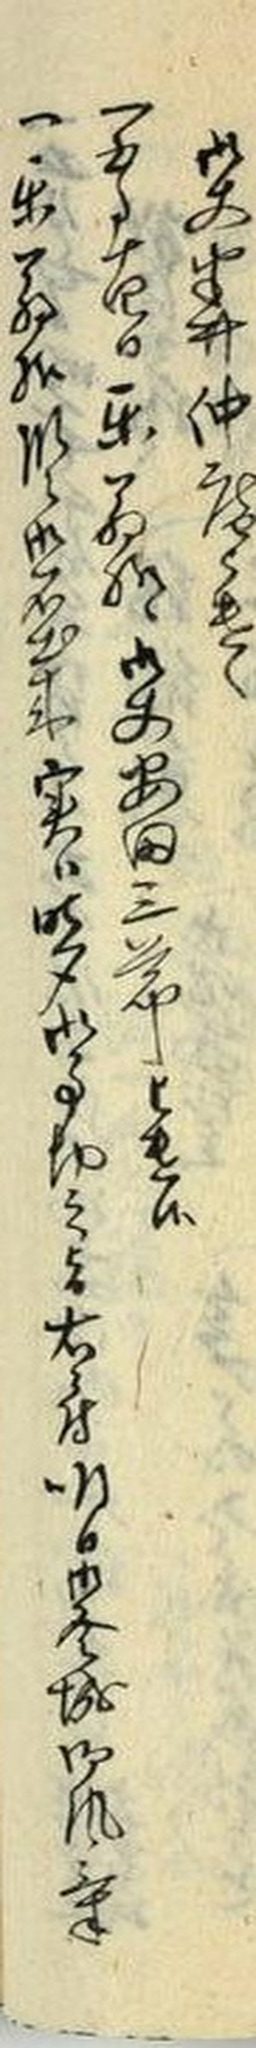一楽翁様段々御不出来実ハ昨夕御事切之旨右ニ付明日御登城御風気
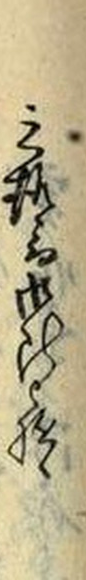之趣ニ而御断被遊候
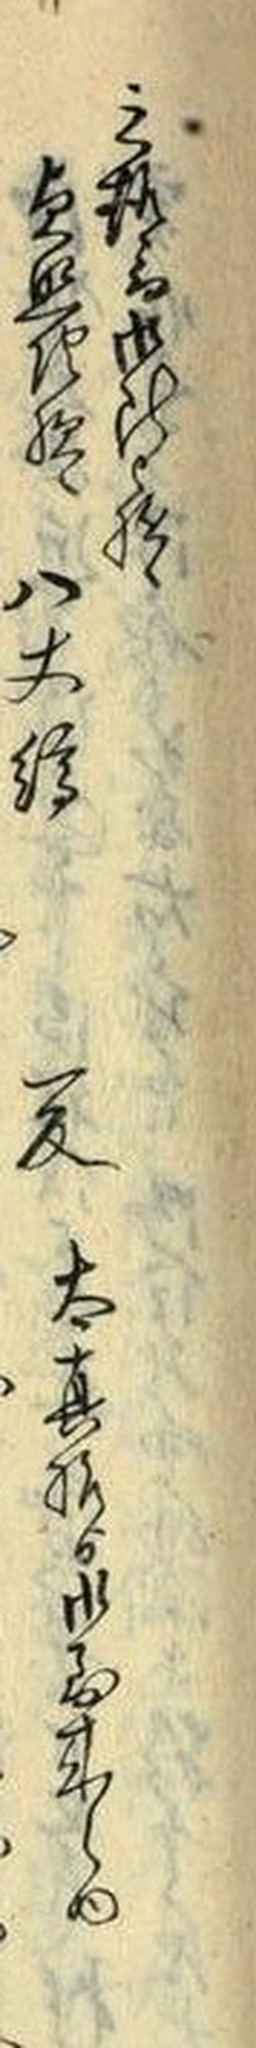貞照院様へ八丈縞一反太真様ゟ御到来之内
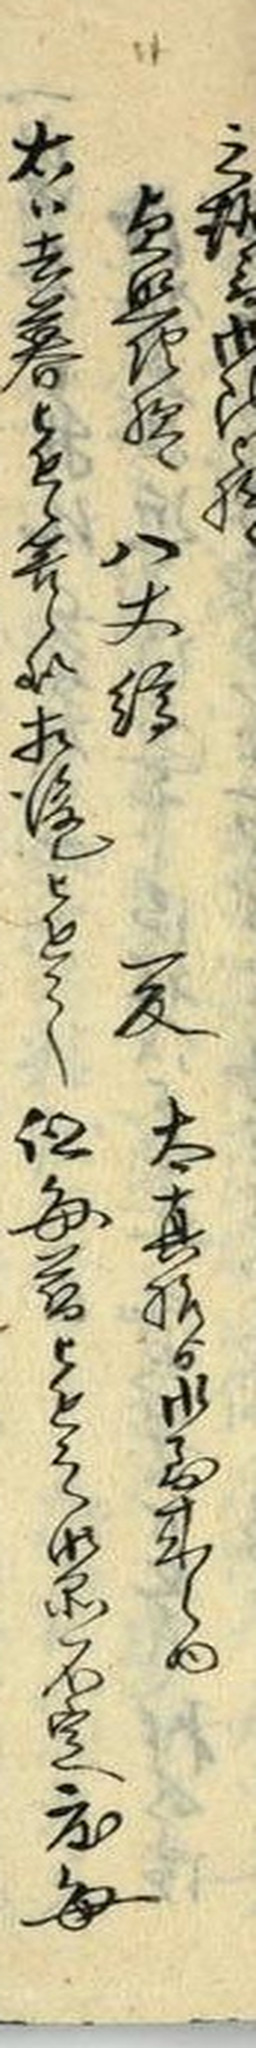右ハ去暮被進之筈之処相後レ被進之但毎暮被進之御品不定度毎
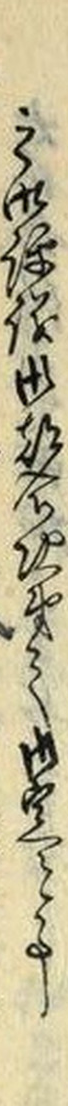之御評議御都合次第之御定ニ候事
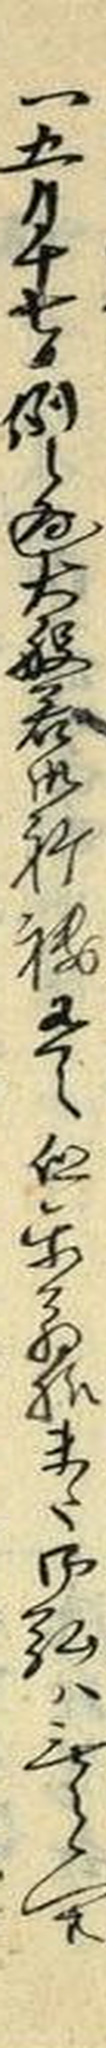一五月十七日例之通大般若御祈祷有之但楽翁様未た御弘ハ無之候へ共
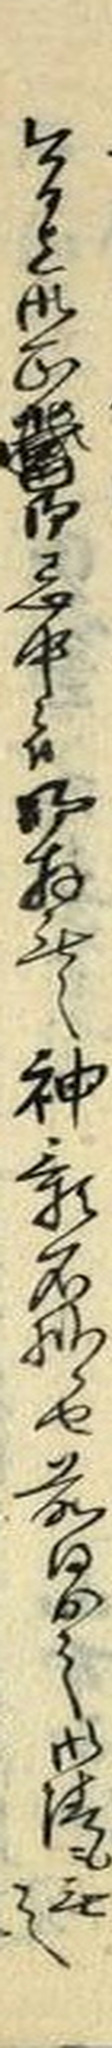今日迄御正御忌中ニ付御拝無之神影不掛候由前日ゟ之御清も無之
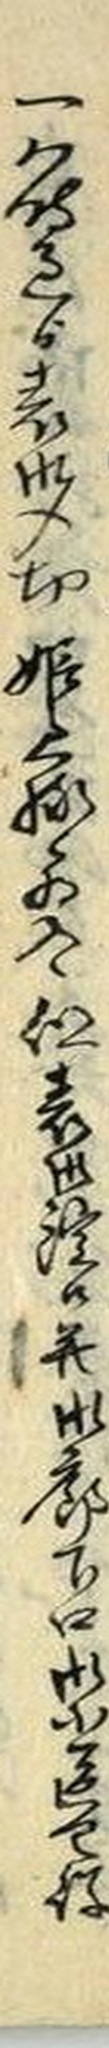一八時過ゟ表御〆切姫君様被為入候但表御錠口并御廊下口御小道具役
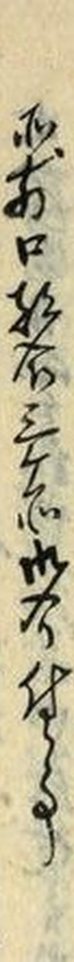所前口都合三ヶ所御〆り付候事
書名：少傅日録抄（斉承付側向頭取日記、在府）
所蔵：福井県文書館 Fukui Prefectural Archives
